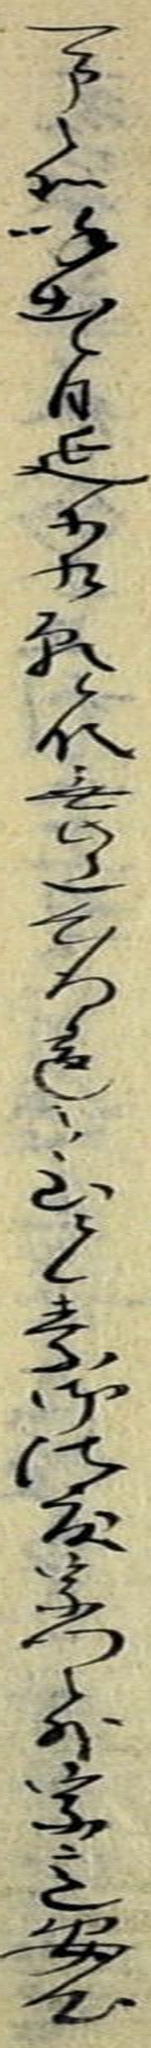可申候処呼出之日延等相願候段無此上心得違之至に候素御法度宗門之外宗意安心
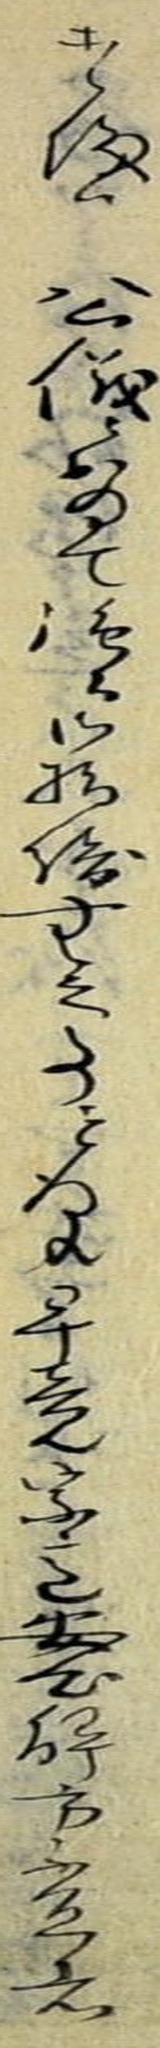等之儀は公儀におゐて強而御指図無之事に候得共畢竟宗意安心解方不宜者
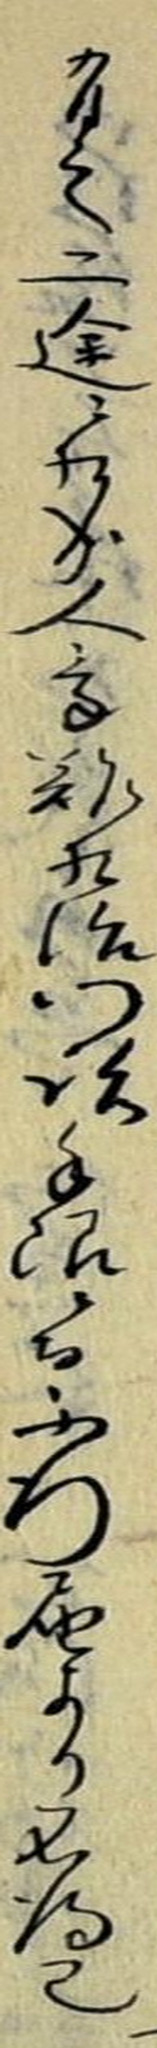有之二途に相成人等難相治門跡手限に而不行届により不得已
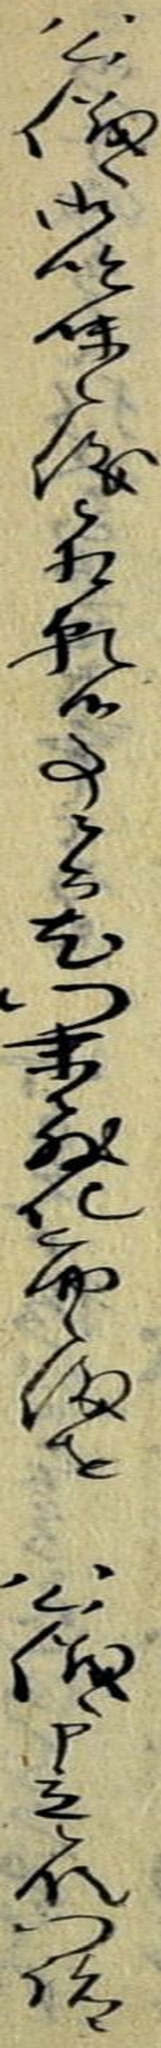公儀へ御吟味之儀被相願候事に而尤門末教化筋之儀を公儀へ申立候段門跡に
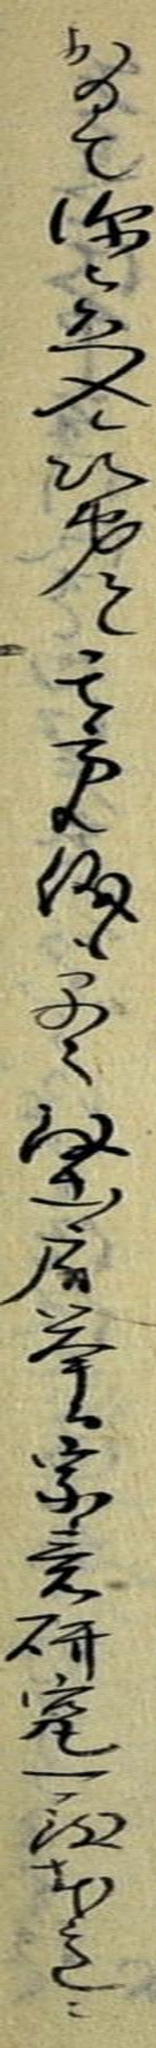おゐて深く恐入候次第に候其方共儀も早々致出府挙而宗意研究可致本意に
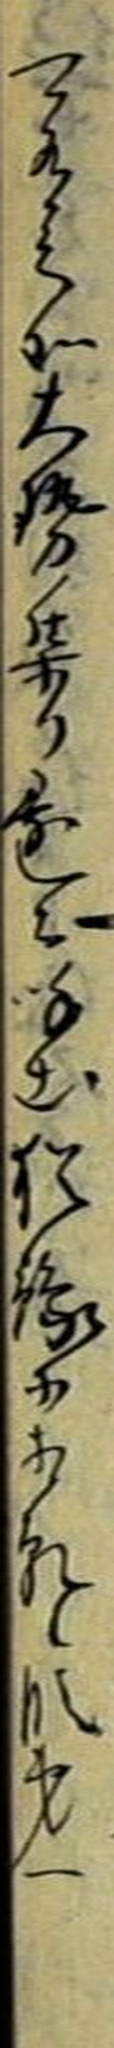可有之候処大勢集り達而呼出猶予等相願候段第一
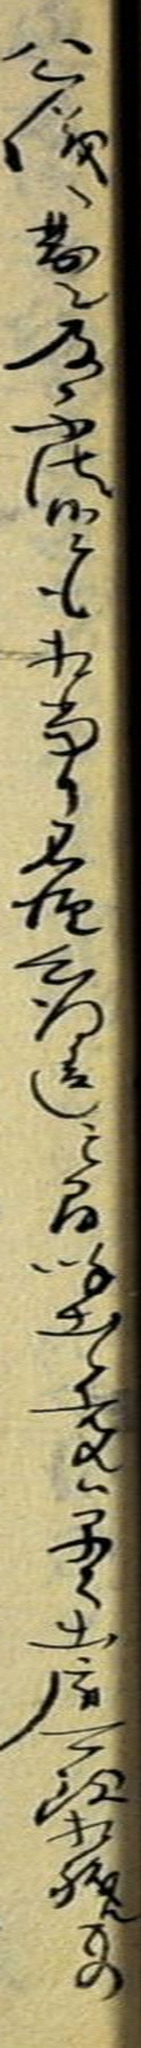公儀へ甚被及不法候にも相当り不軽心得違に候間呼出之者共は早々出府可致相残候もの
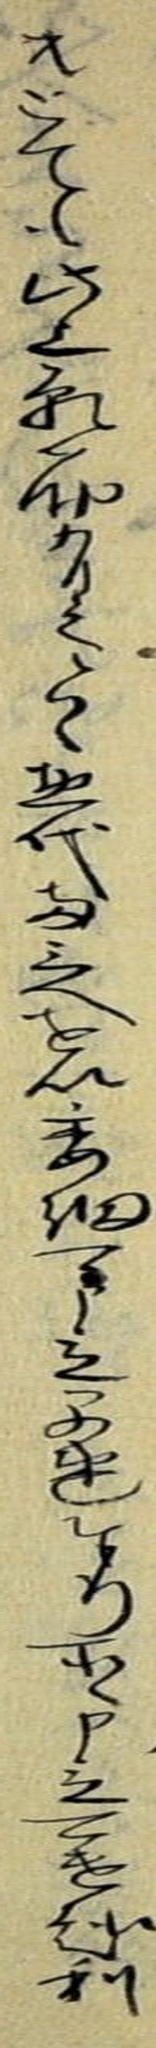共にても此上願筋有之候はヽ惣代両三人を以委細可申立早速奉行所へ申立可遣趣利
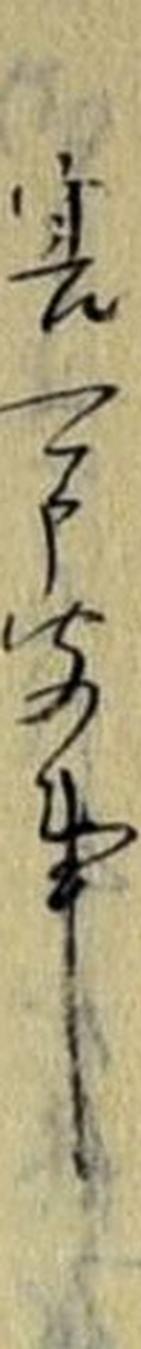害可申聞事
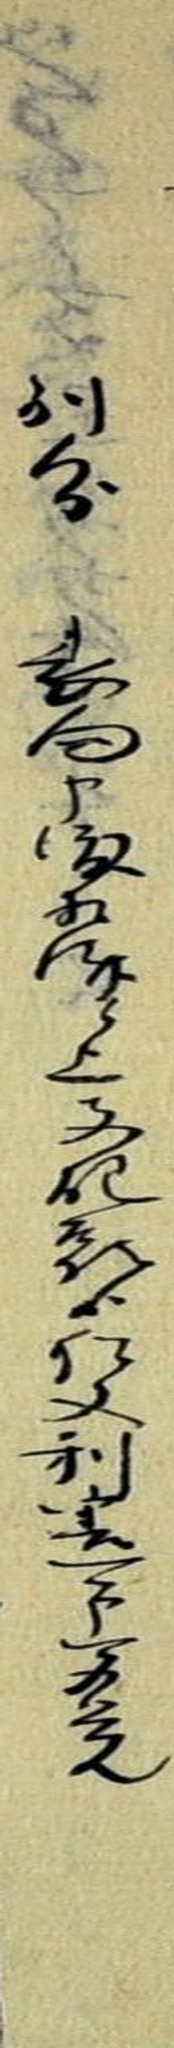別紙表向申渡相済候上支配頭ゟ猶又利害可申聞覚
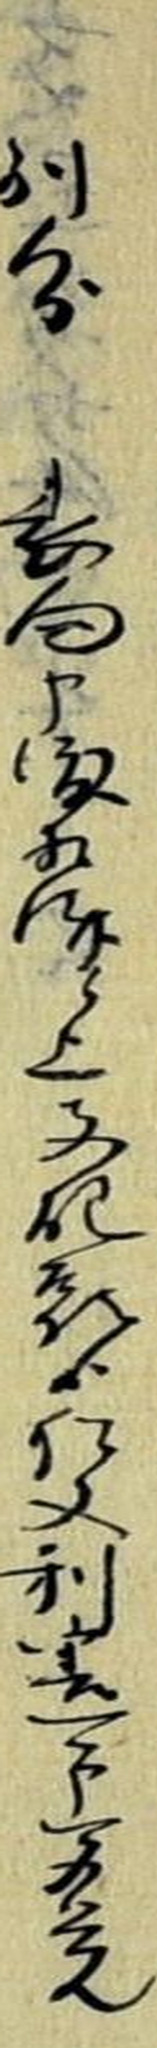別紙表向申渡相済候上支配頭ゟ猶又利害可申聞覚
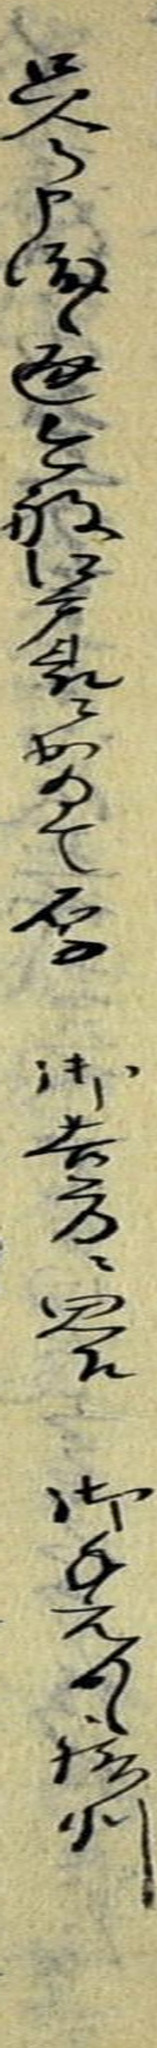只今申渡候通今般江戸表におゐて厚御苦労に思召御手元ゟも格別
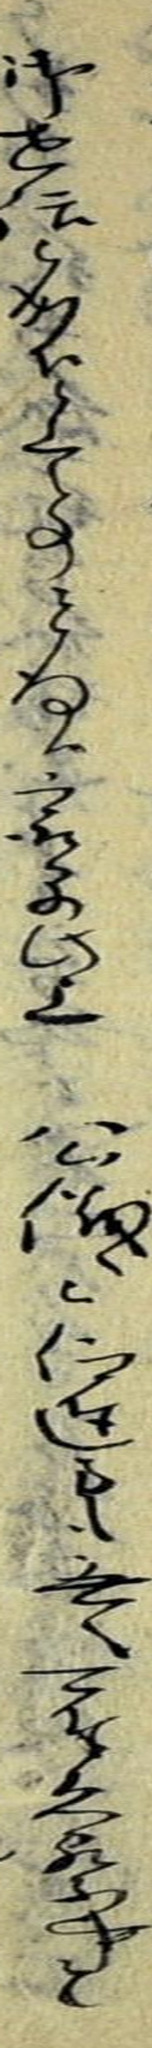御世話被成下候上之事に候得は最早此上公儀へ被仰達事も無之可奉之察事に候
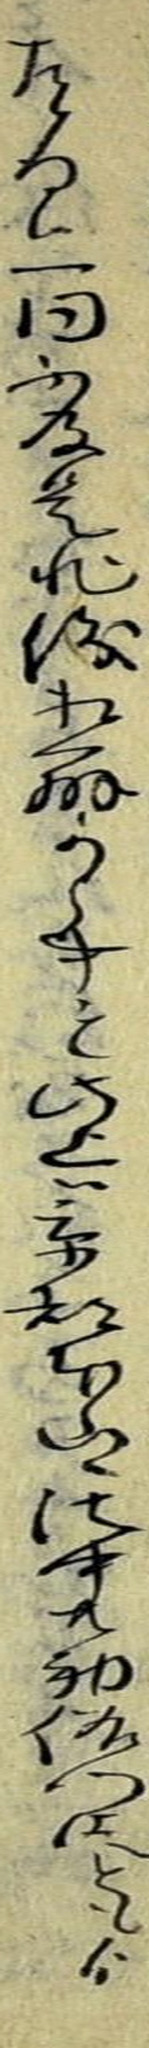左候得は一同不及是非儀相弁可事に候此上は京都本山へ法中共初俗門徒ともゟ
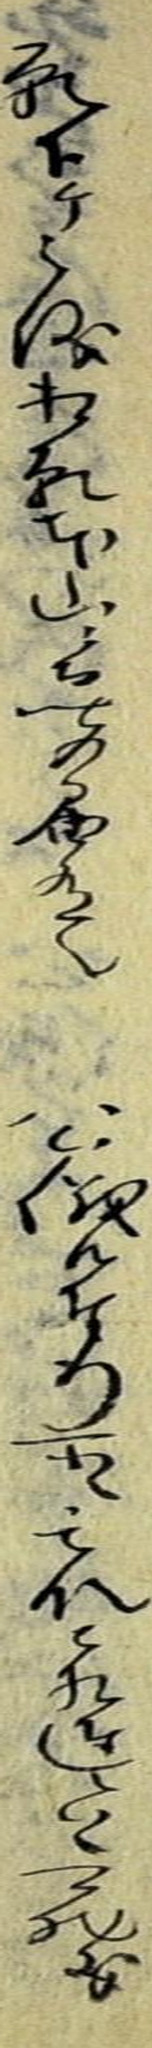願下ヶ候儀相願本山に而聞届有之公儀御奉行所へ其段被相達候はヽ可然義
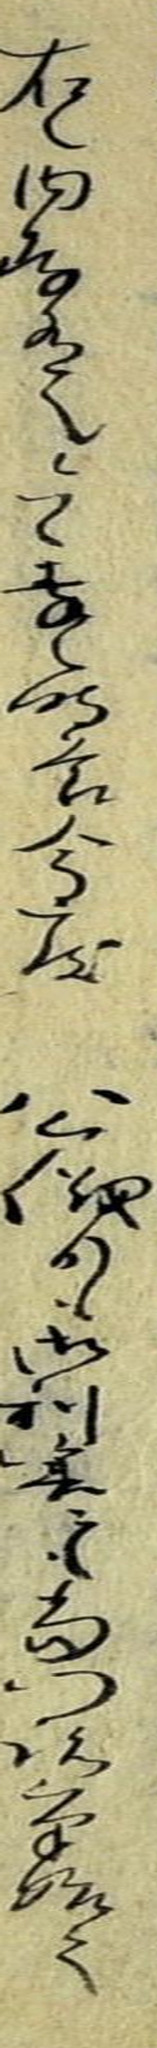右之内存有之候はヽ幸之時節今度公儀ゟも御利害にも尚門跡争始之
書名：命令之部 四
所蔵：福井県文書館 Fukui Prefectural Archives
